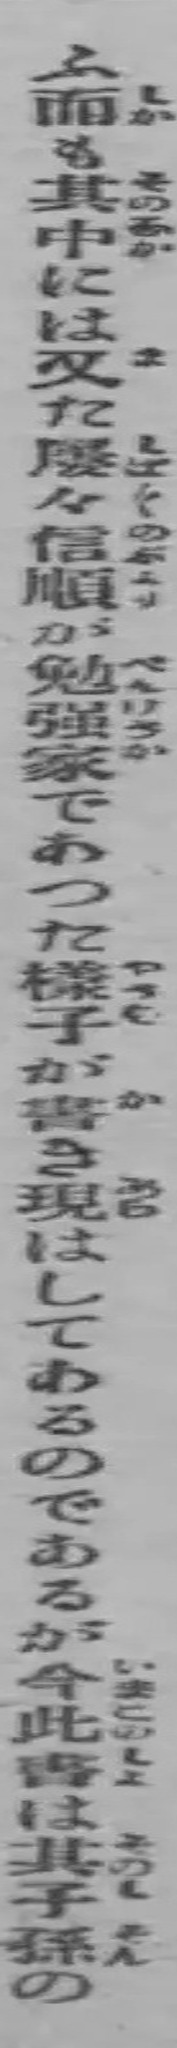ふ而も其中には又た屡々信順が勉強家であつた様子が書き現はしてあるのであるが今此書は其子孫の
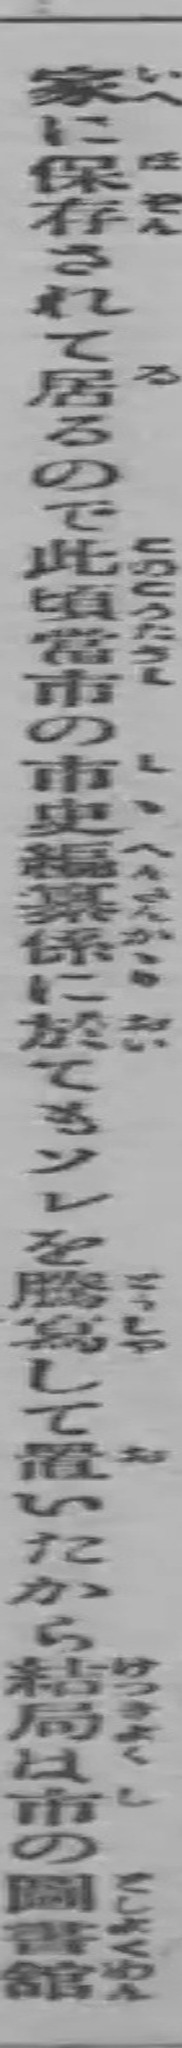家に保存されて居るので此頃当市の市史編纂係に於てもソレを謄写して置いたから結局は市の図書館
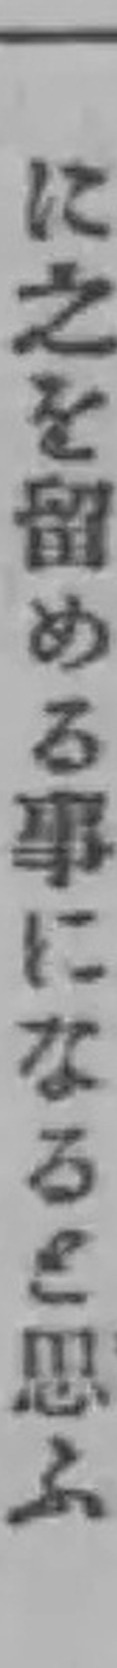に之を留める事になると思ふ
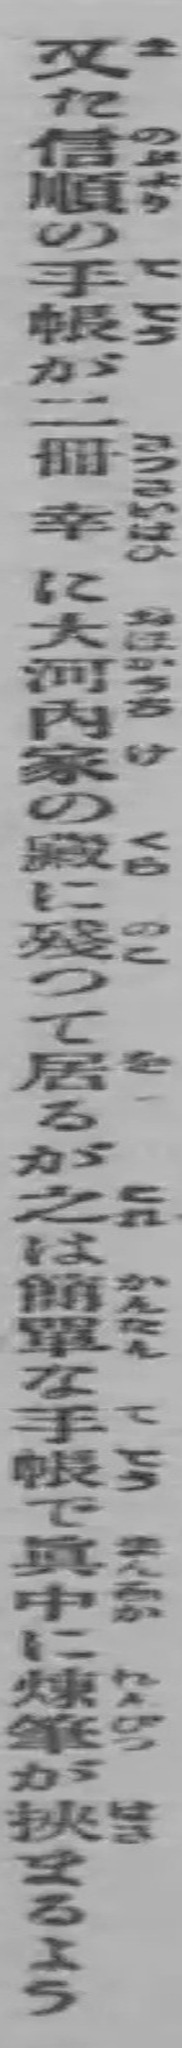又た信順の手帳が二冊幸に大河内家の蔵に残つて居るが之は簡単な手帳で真中に煉筆が挟まるよう
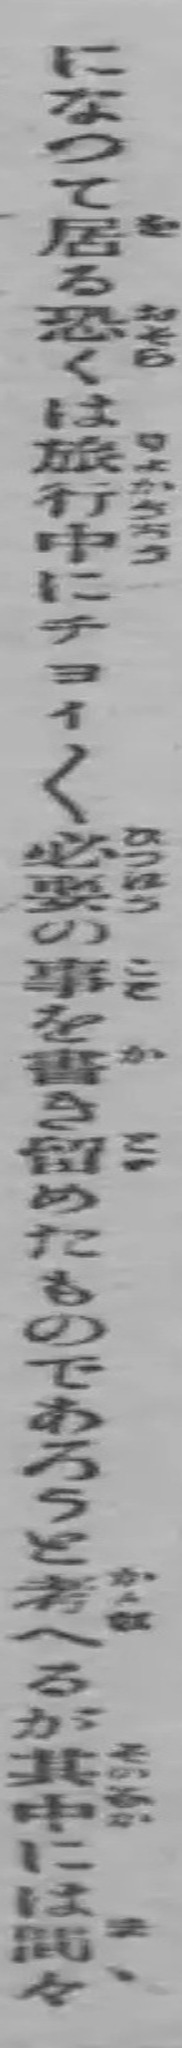になつて居る恐くは旅行中にチヨイ〳〵必要の事を書き留めたものであろうと考へるが其中には間々
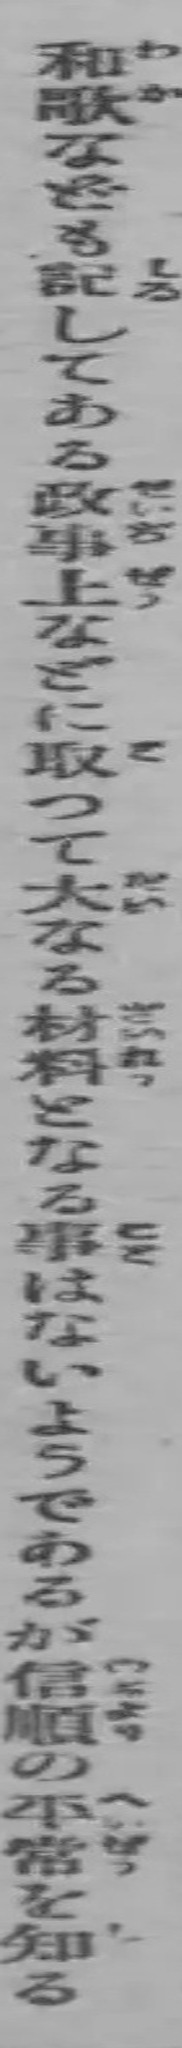和歌なども記してある政事上などに取つて大なる材料となる事はないようであるが信順の平常を知る
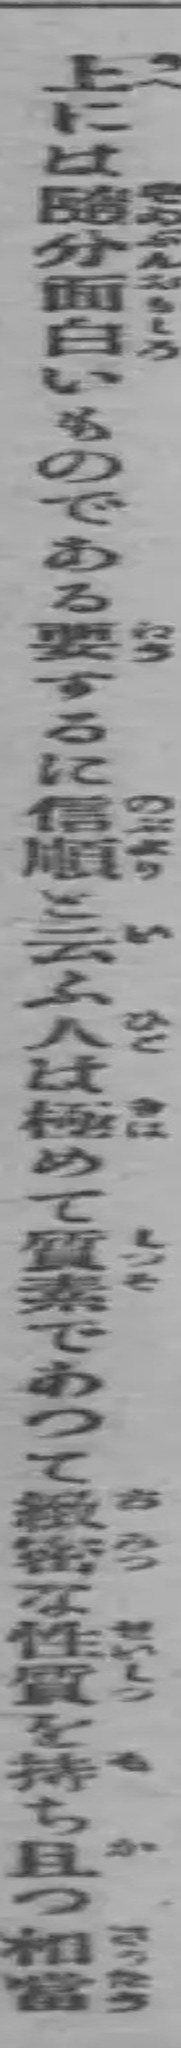上には随分面白いものである要するに信順と云ふ人は極めて質素であつて緻密な性質を持ち且つ相当

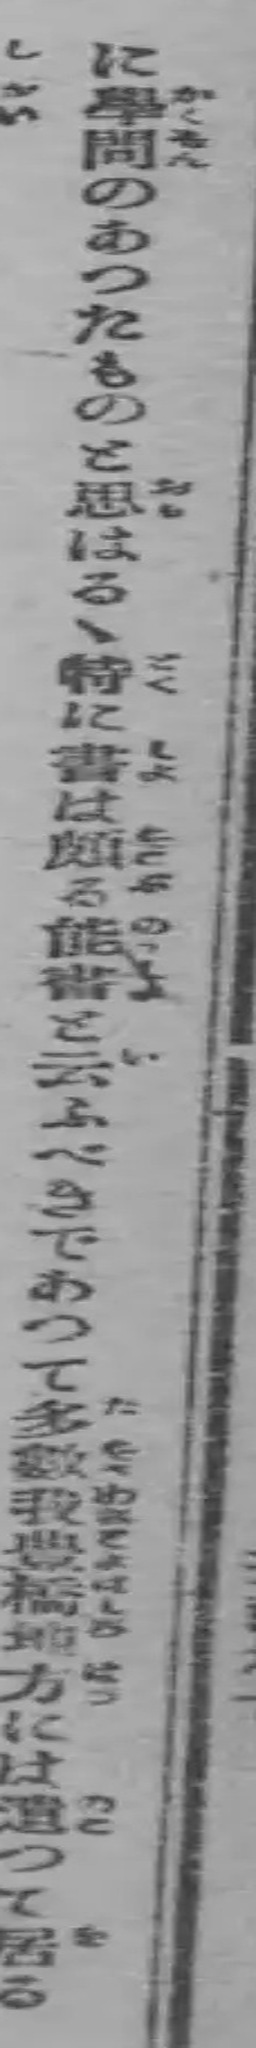に学問のあつたものと思はるゝ特に書は頗る能書と云ふべきであつて多数我豊橋地方には遺つて居る
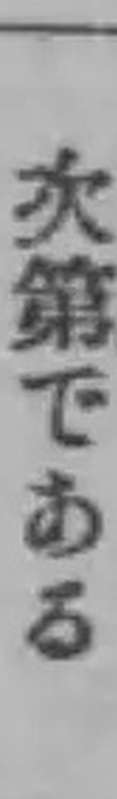次第である
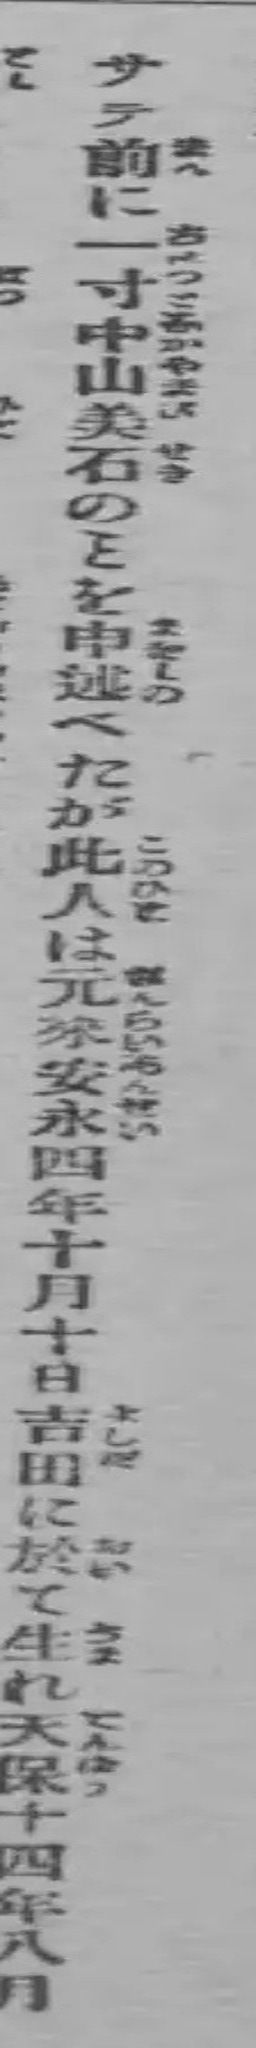サテ前に一寸中山美石のことを申述べたが此人は元来安永四年十月十日吉田に於て生れ天保十四年八月
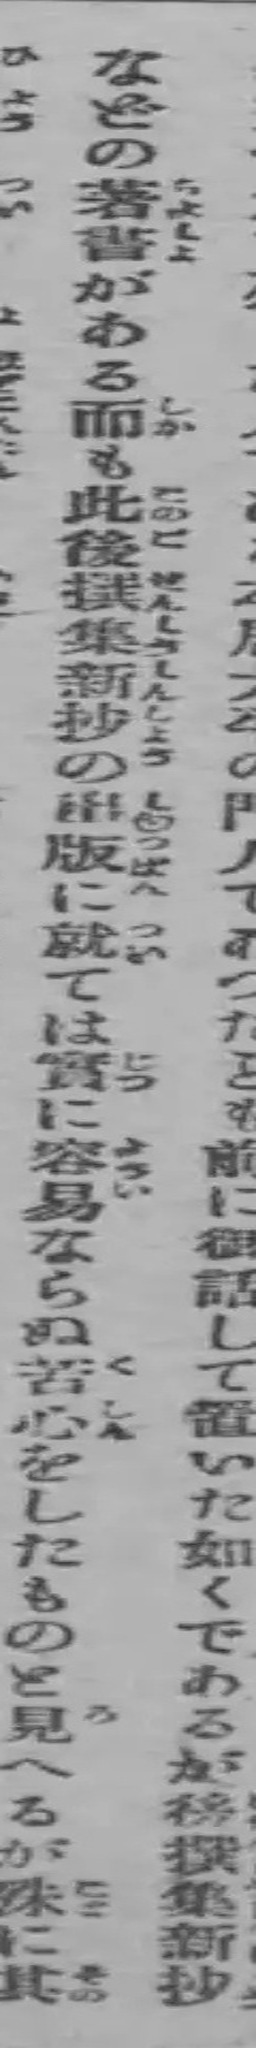などの著書がある而も此後撰集新抄の出版に就ては実に容易ならぬ苦心をしたものと見へるが殊に其
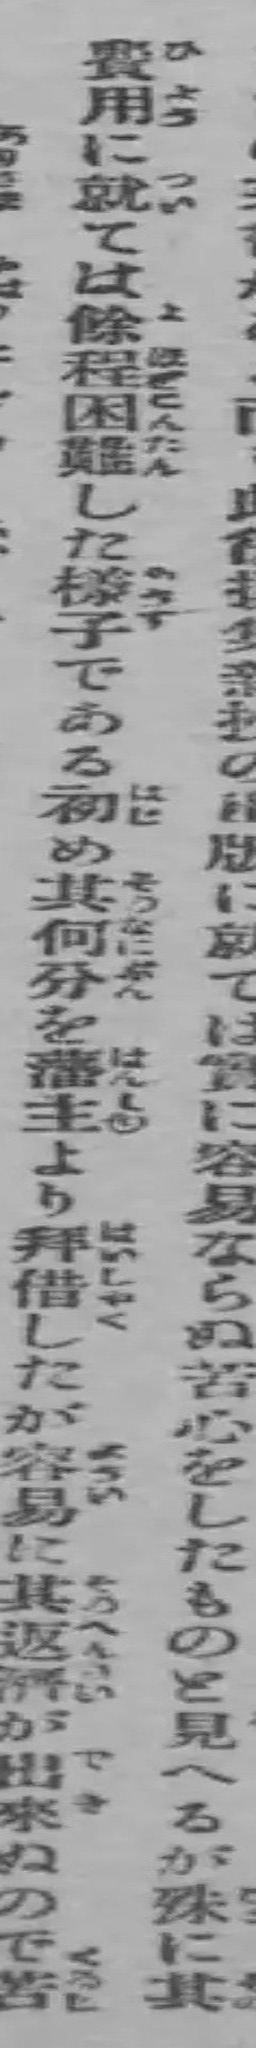費用に就ては余程困難した様子である初め其何分を藩主より拝借したが容易に其返済が出来ぬので苦
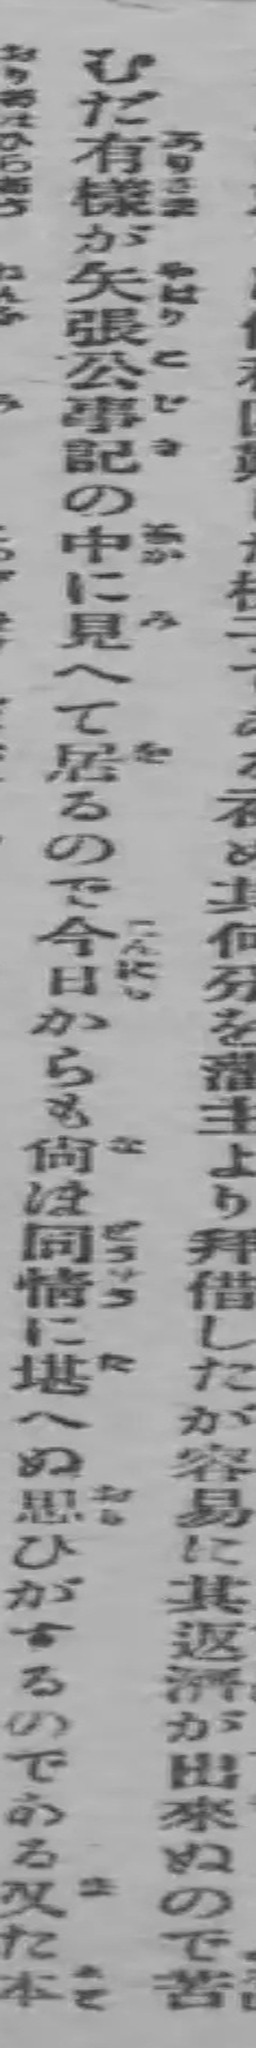むだ有様が矢張公事記の中に見へて居るので今日からも尚ほ同情に堪へぬ思ひがするのである又た本
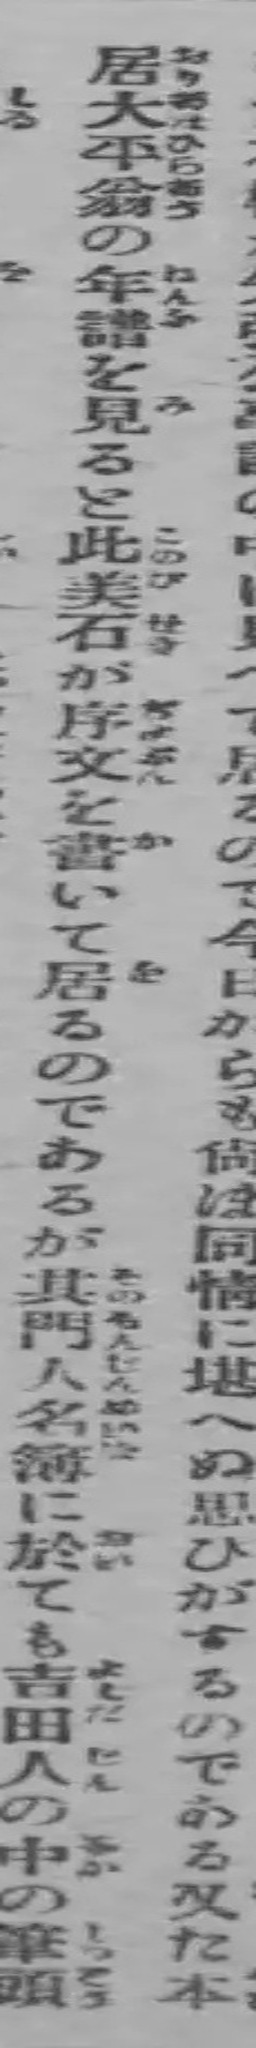居大平翁の年譜を見ると此美石が序文を書いて居るのであるが其門人名簿に於ても吉田人の中の筆頭
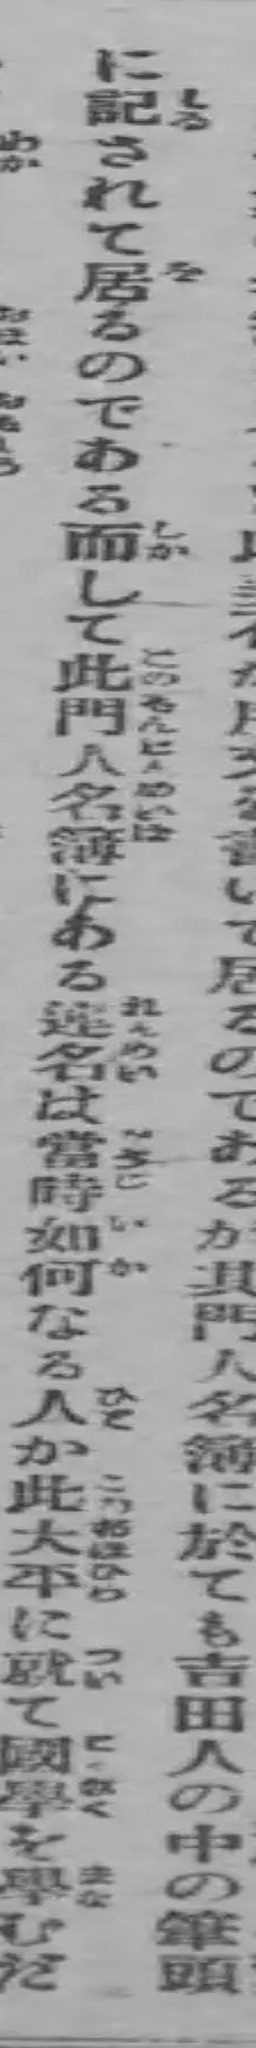に記されて居るのである而して此門人名簿にある連名は当時如何なる人か此大平に就て国学を学むだ
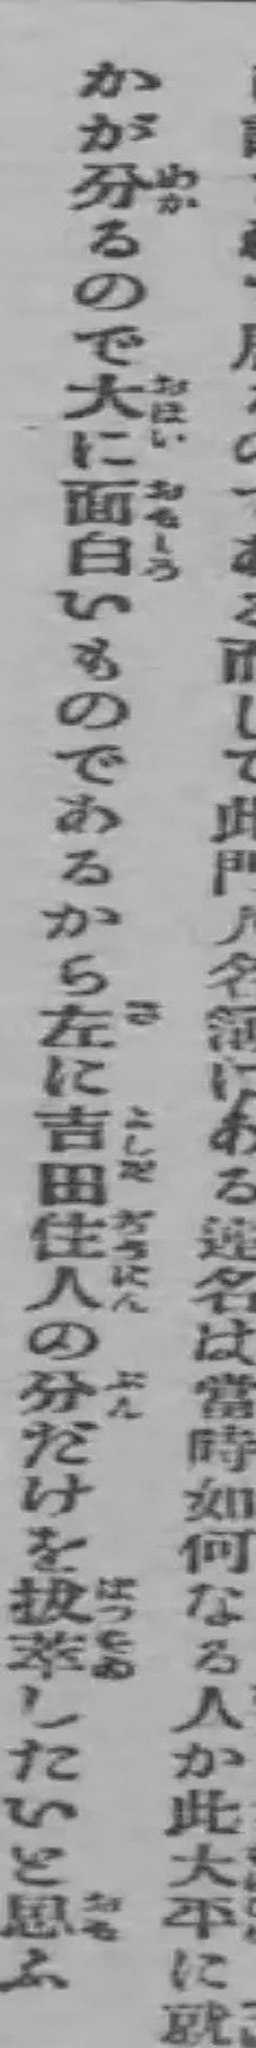かが分るので大に面白いものであるから左に吉田住人の分だけを抜萃したいと思ふ
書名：豊橋市史談
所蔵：国立国会図書館 National Diet Library, JAPAN
